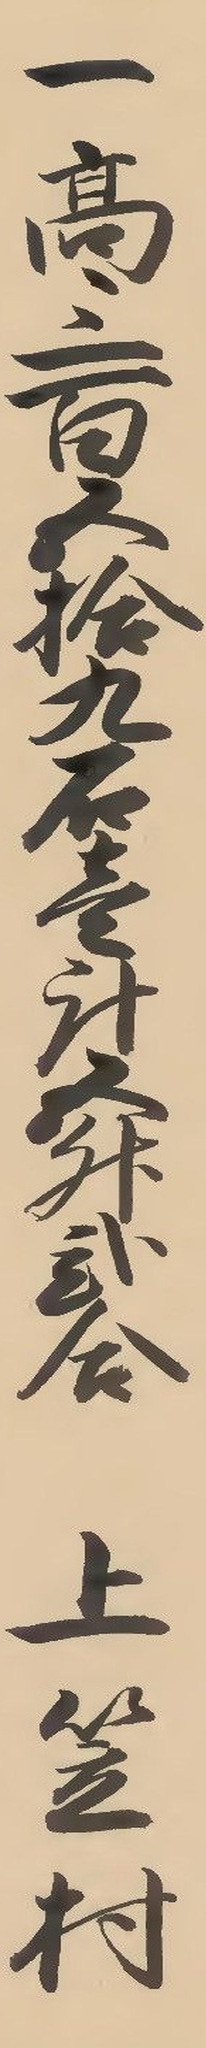一高三百五拾九石壱斗五升弐合上笠村
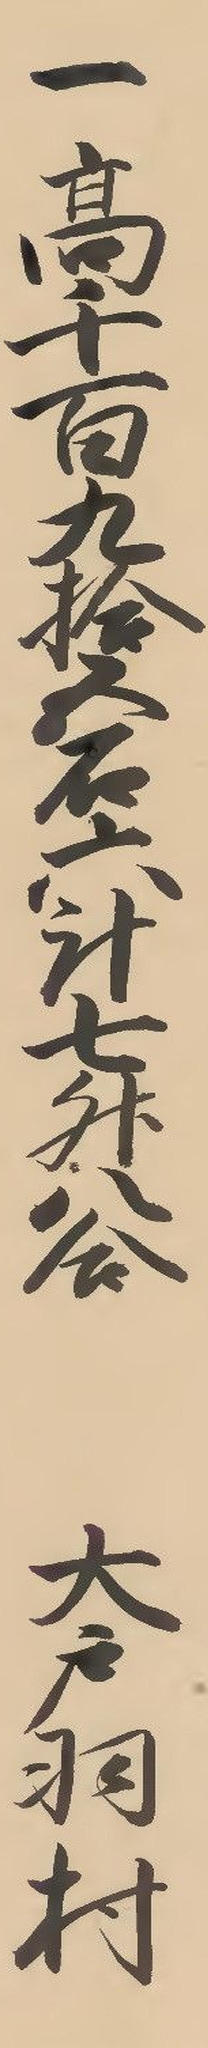一高千百九拾五石六斗七升八合大戸羽村
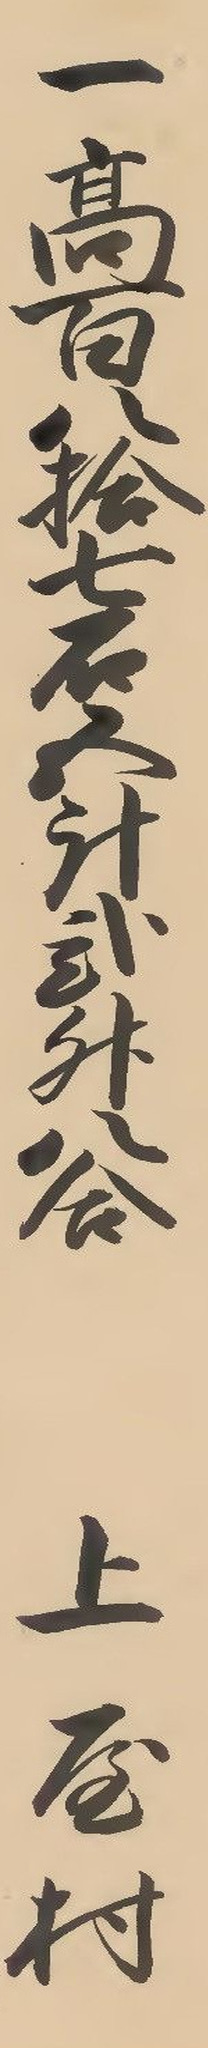一高百八拾七石五斗弐升八合上屋村
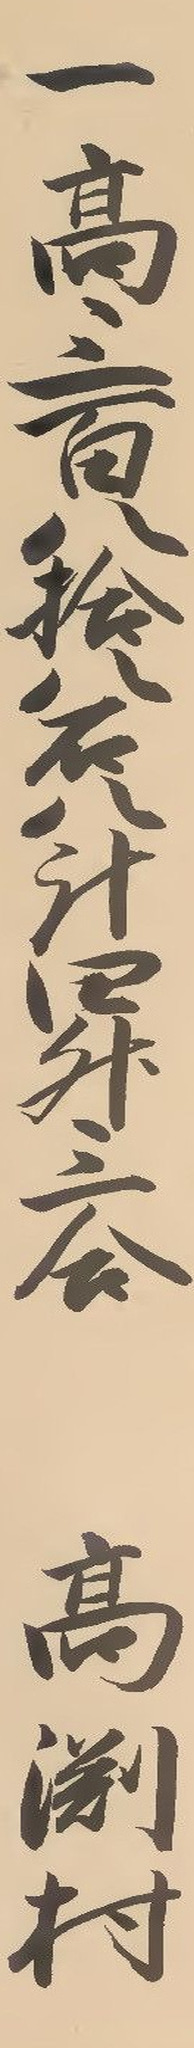一高三百八拾八石八斗四升三合高渕村
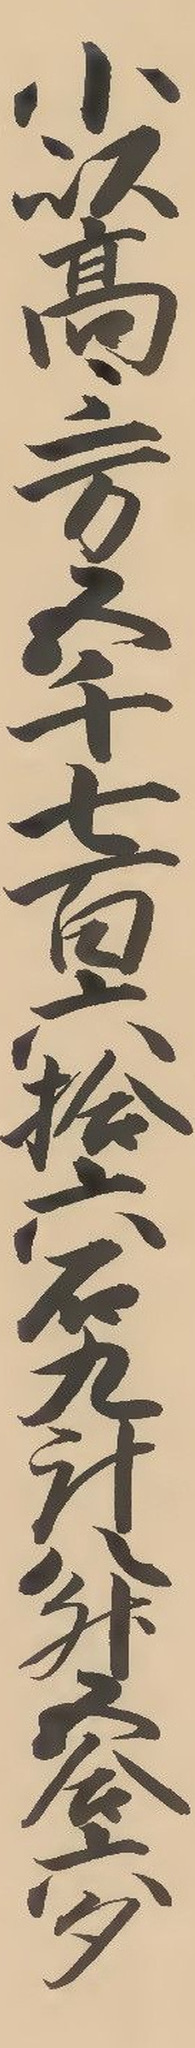小以高三万五千七百六拾六石九斗八升五合六勺

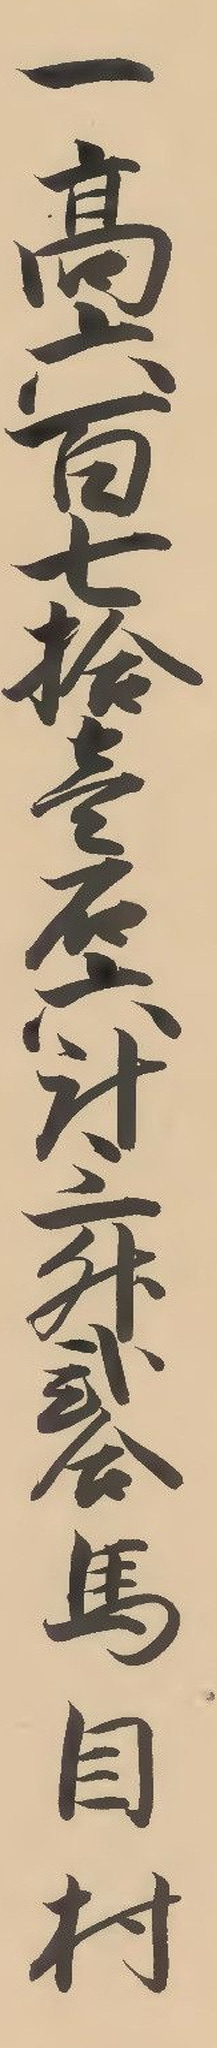一高六百七拾壱石六斗三升弐合馬目村
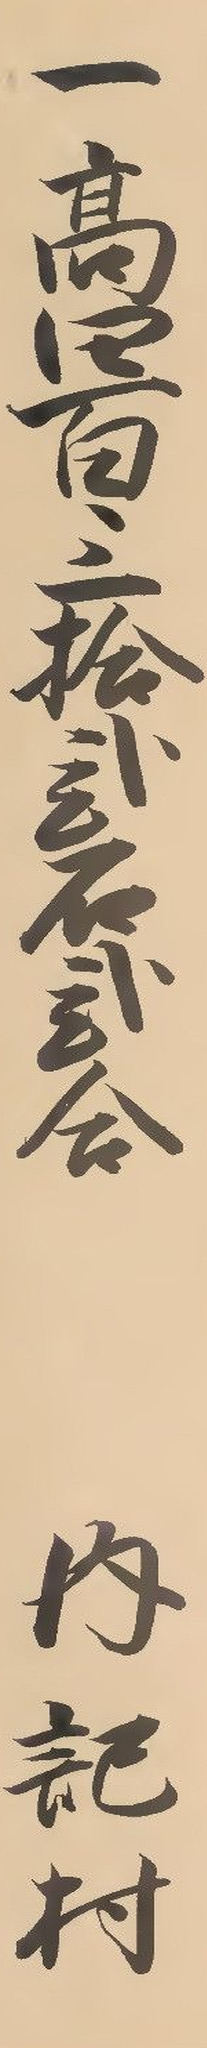一高四百三拾弐石弐合内記村
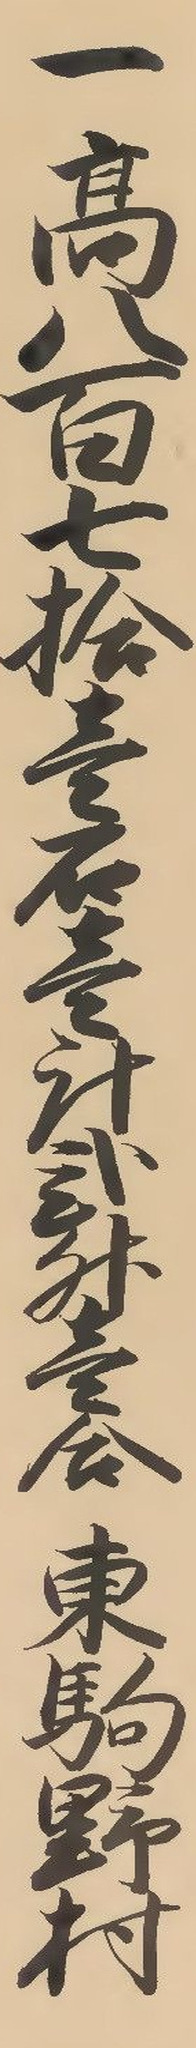一高八百七拾壱石壱斗弐升壱合東駒野村
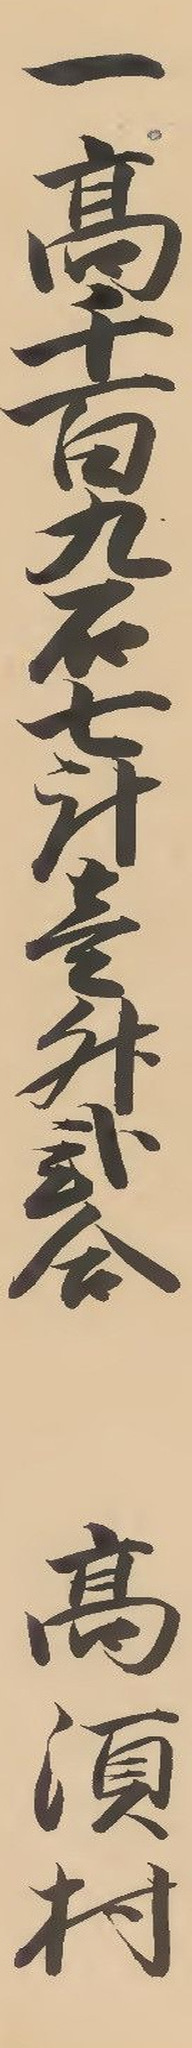一高千百九石七斗壱升弐合高須村

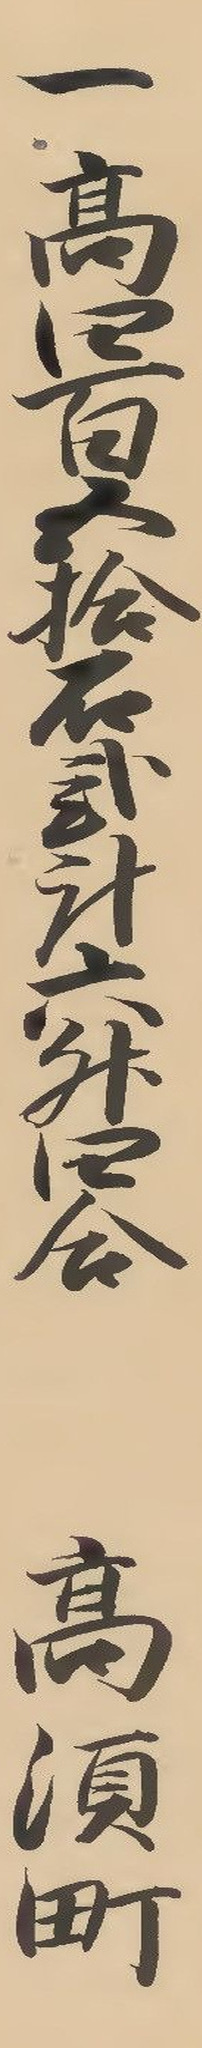一高四百五拾石弐斗六升四合高須町
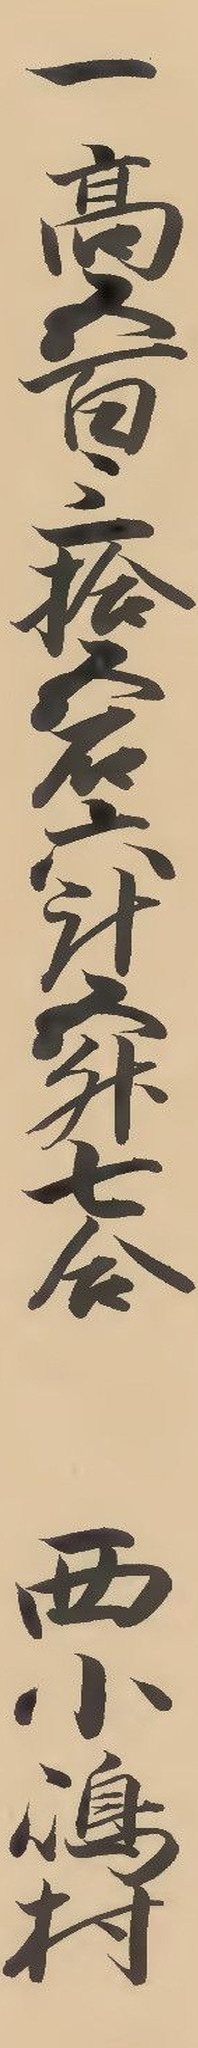一高五百三拾五石六斗五升七合西小島村
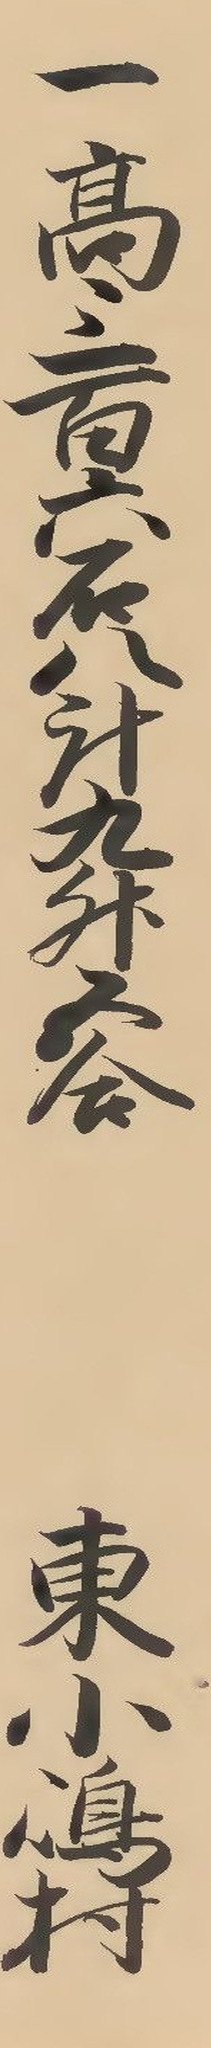一高三百六石八斗九升五合東小島村
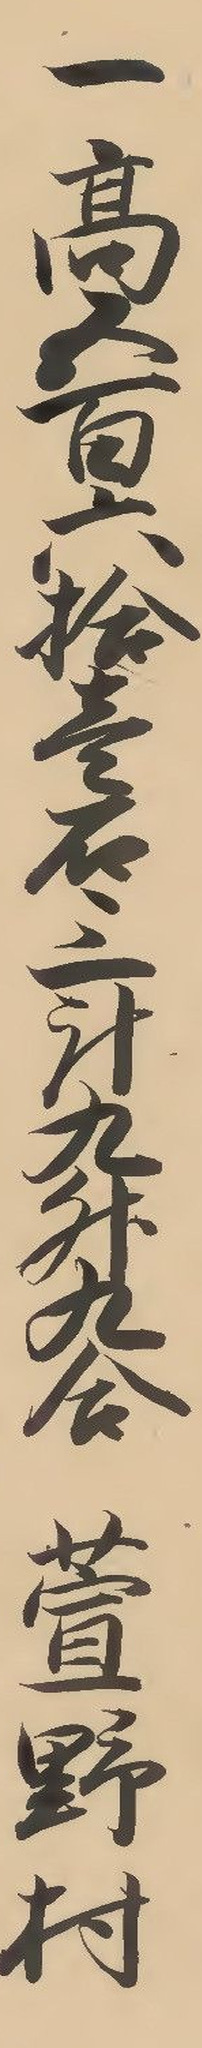一高五百六拾壱石三斗九升九合萱野村
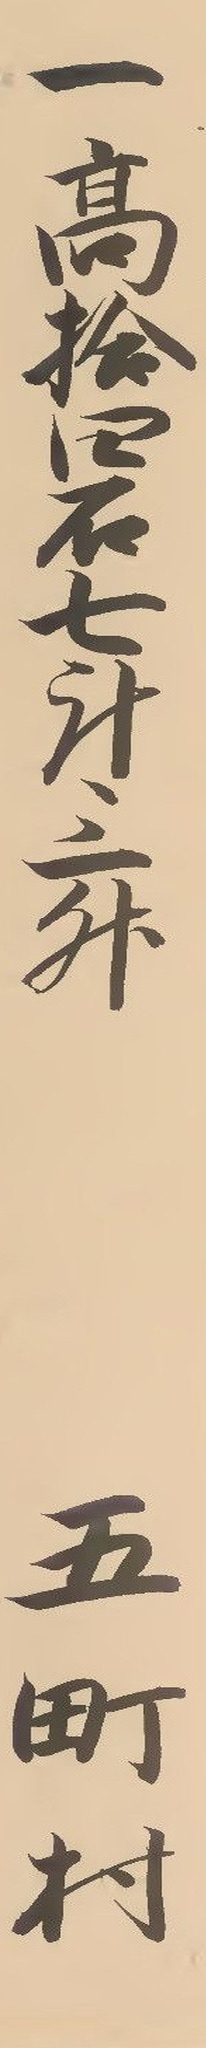一高拾四石七斗三升五町村
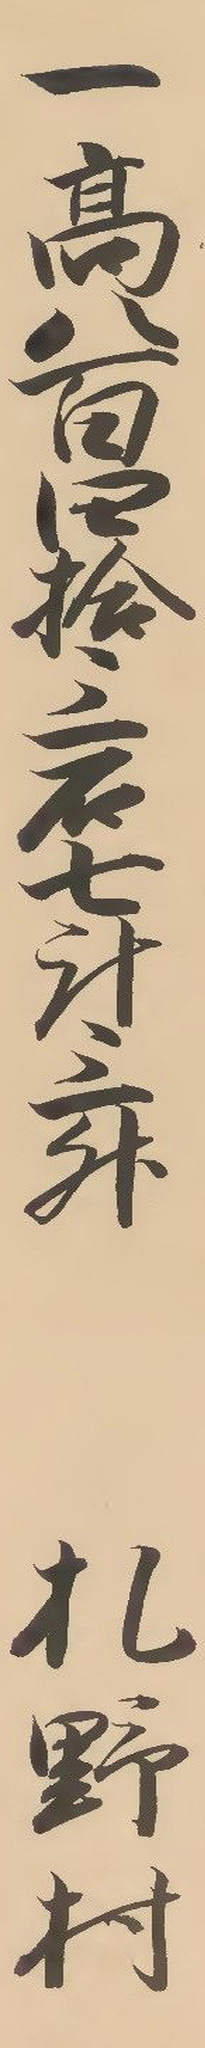一高八百四拾三石七斗三升札野村
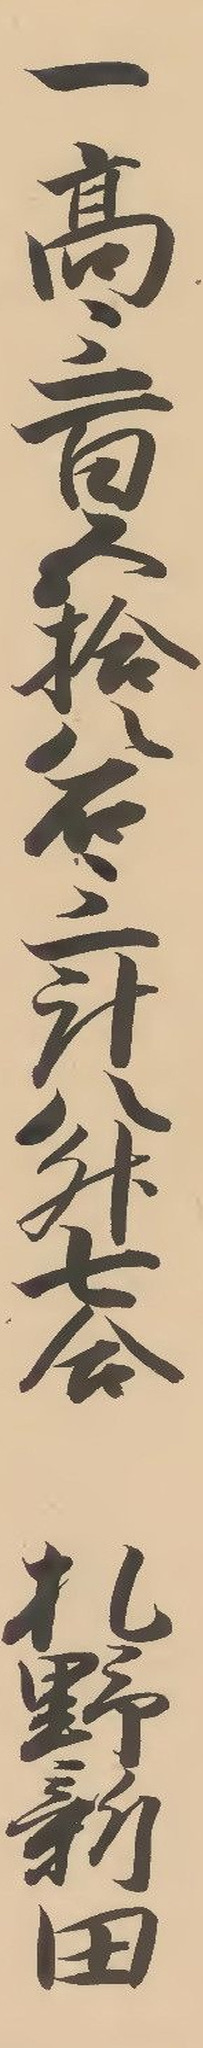一高三百五拾八石三斗八升七合札野新田
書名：美濃国郷帳
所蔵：国立公文書館 National Archives of Japan
